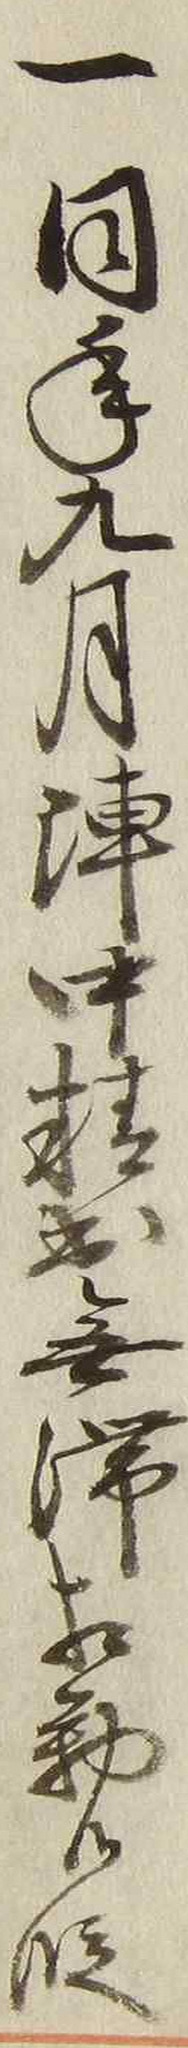一同年九月陣中精出無滞相勤候段
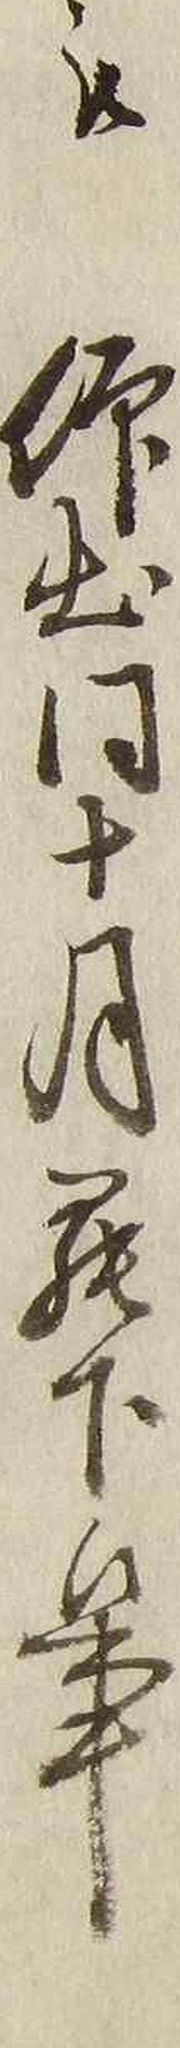被仰出同十月罷下候事

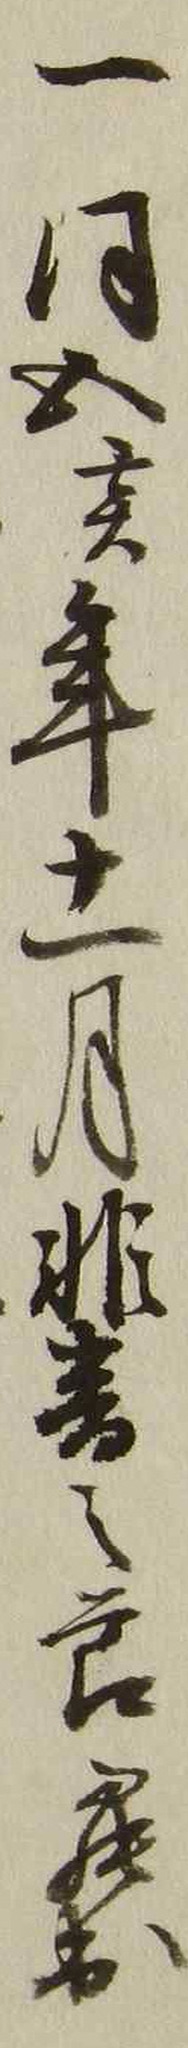一同五亥年十一月非番之節罷出
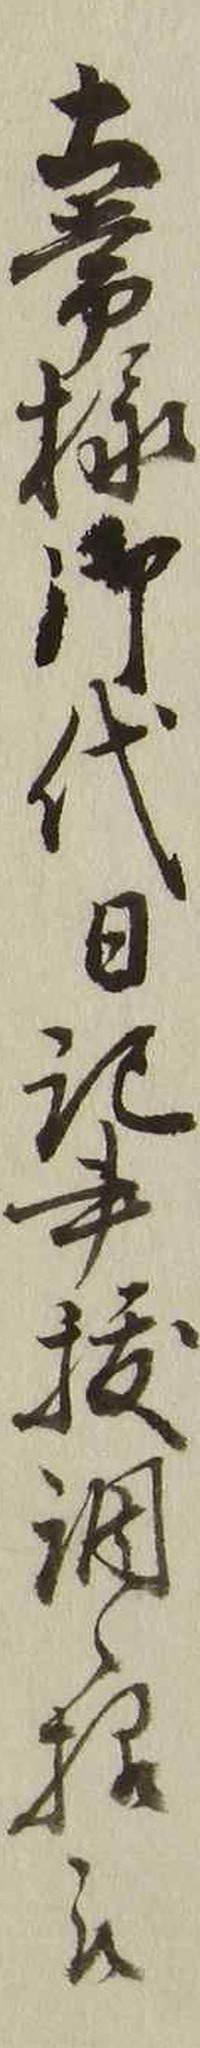土常様御代日記書抜調候様被
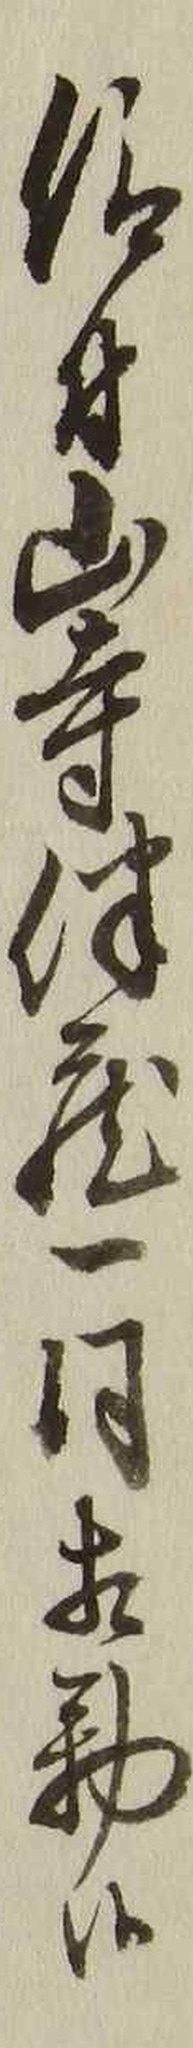仰付山寺伴蔵一同相勤候
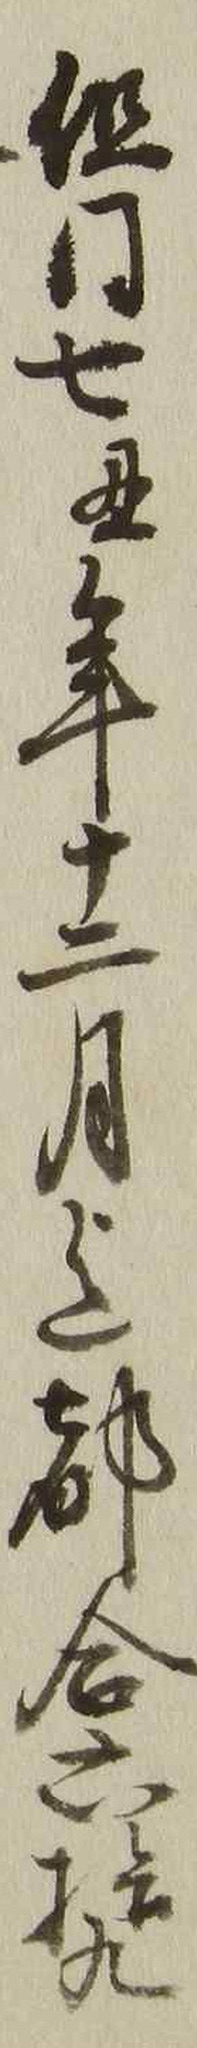但同七丑年十二月迄都合六拾九
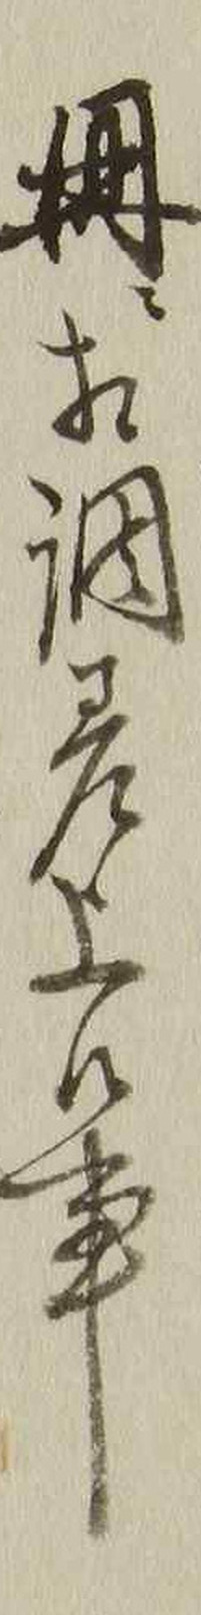冊ニ相調差上候事
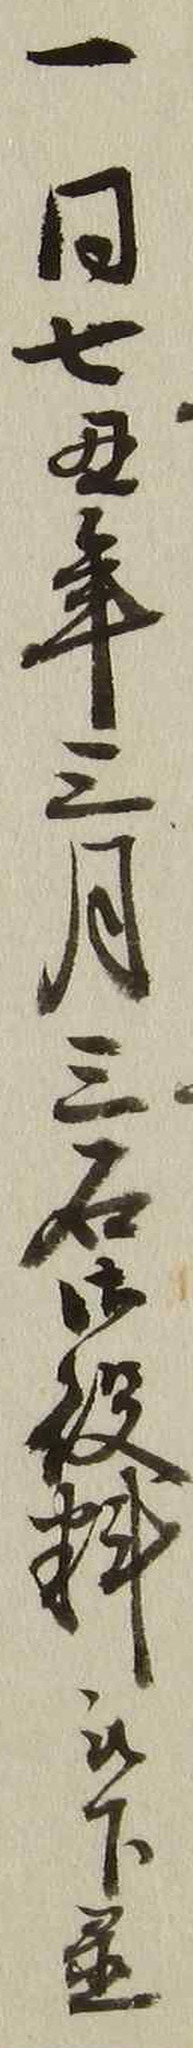一同七丑年三月三石御役料被下置
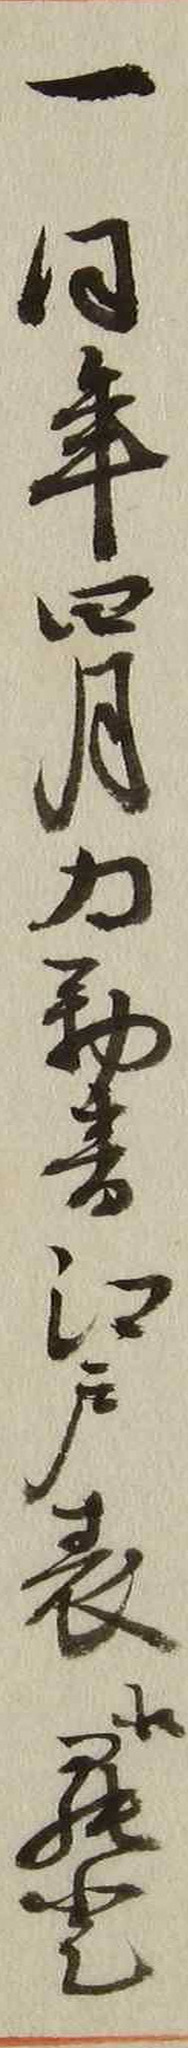一同年四月為勤番江戸表江罷登
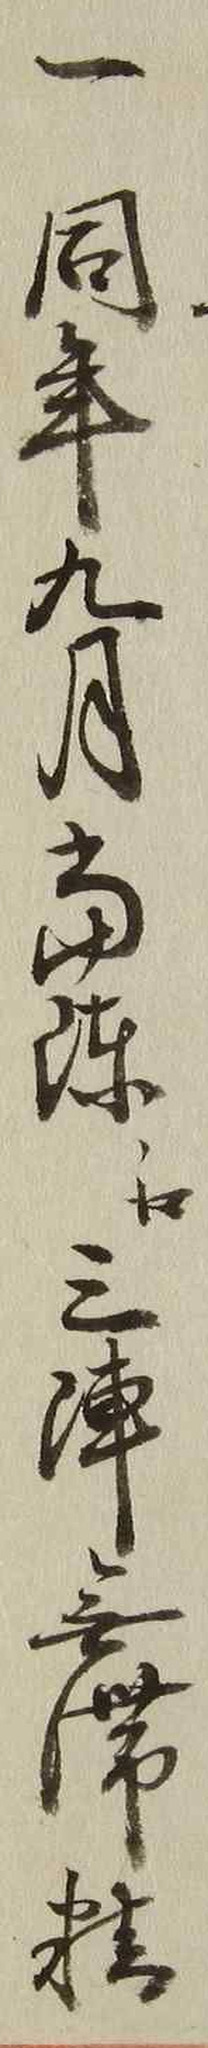一同年九月当陳江三陣無滞精
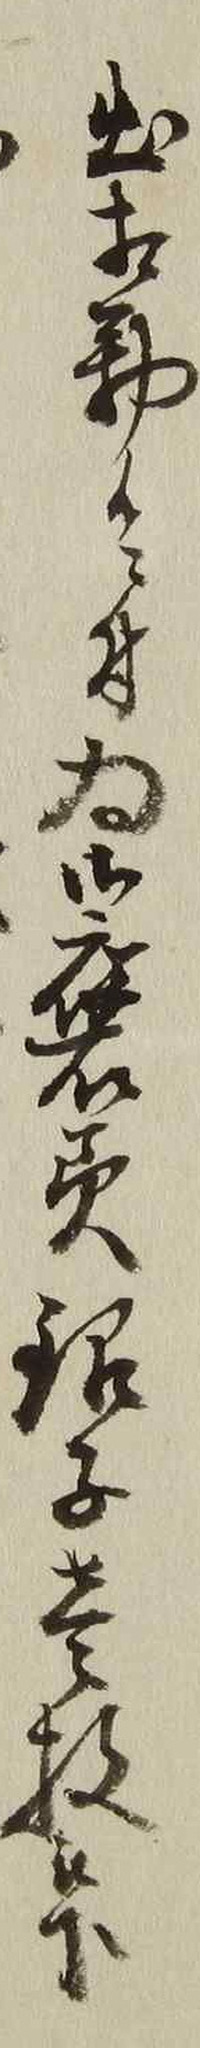出相勤候ニ付為御褒美銀子壱枚被下
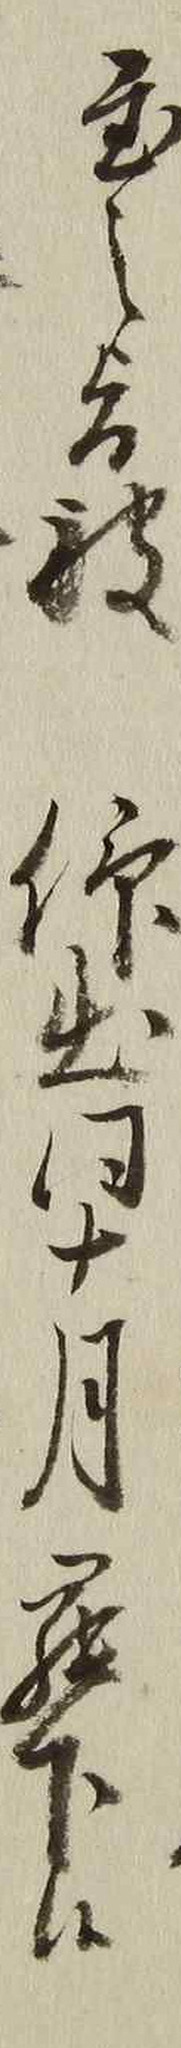置之旨被仰出同十月罷下候
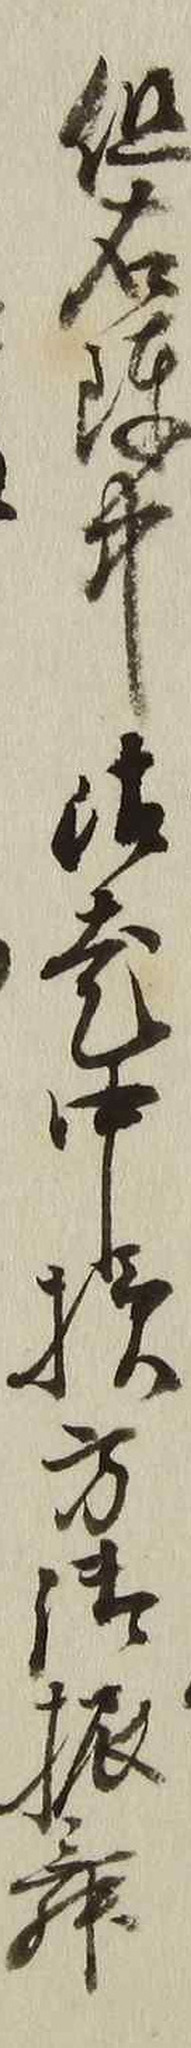但右陣中御老中様方御振舞
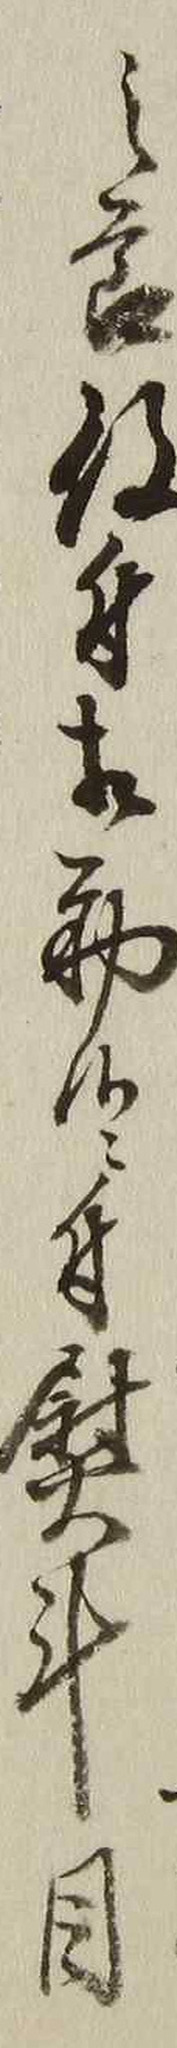之節役付相勤候ニ付熨斗目
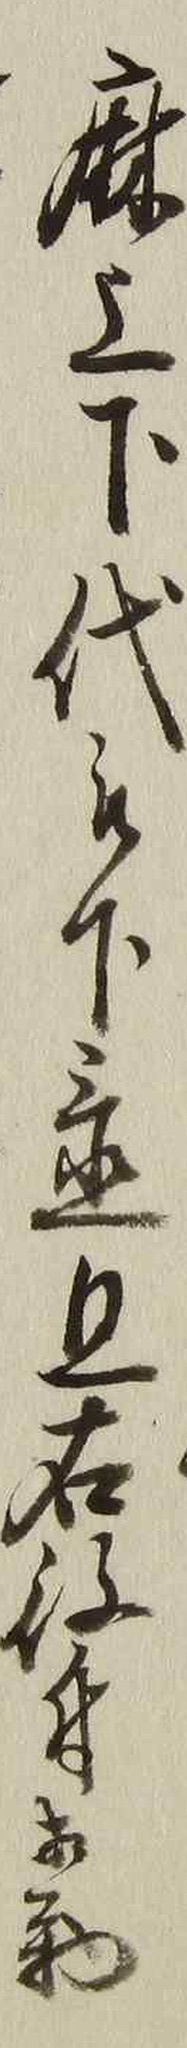麻上下代被下置旦右役付相勤
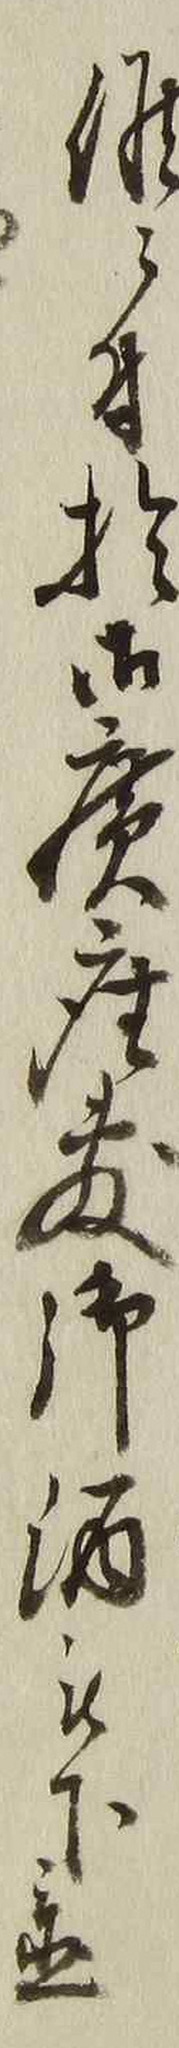候ニ付於御広座敷御酒被下置
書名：諸士系譜　巻之27　い之部27
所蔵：会津若松市立会津図書館
